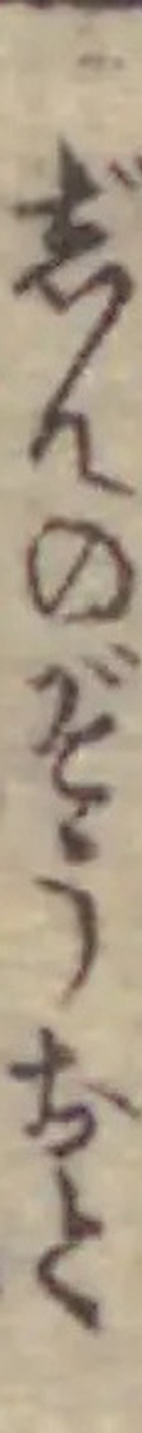じんのぞうおと
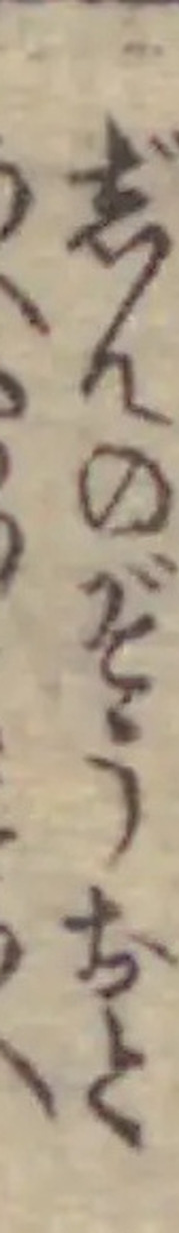じんのぞうおと
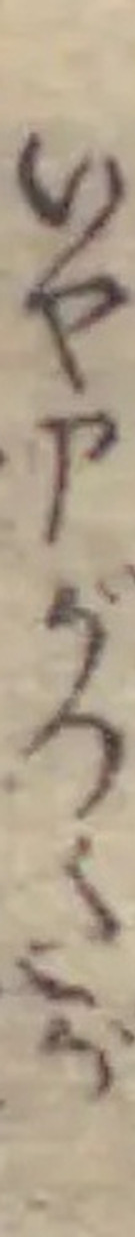いやあがつたが
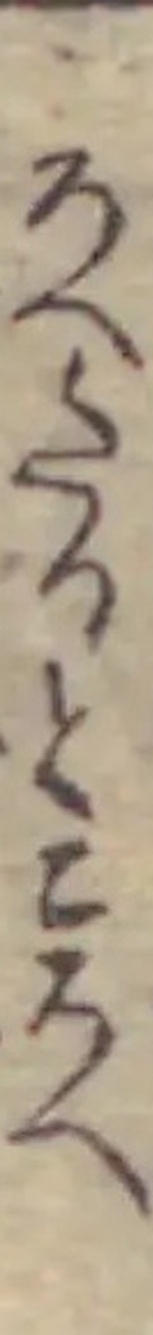ろへたるところへ
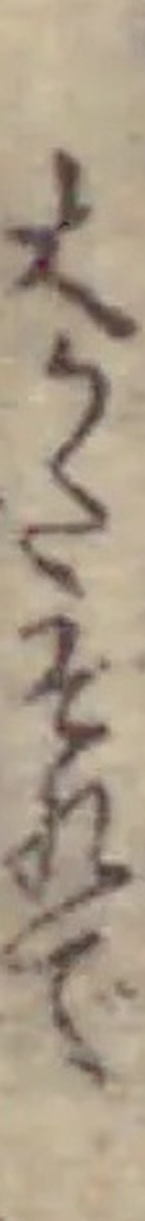大かたそれで
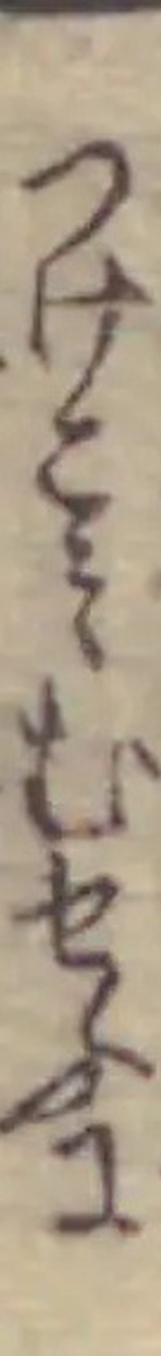つけこみむせふに
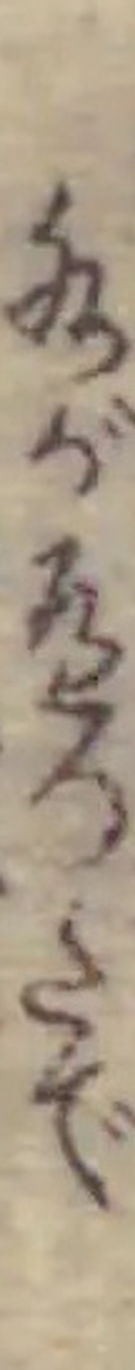水がへつたで
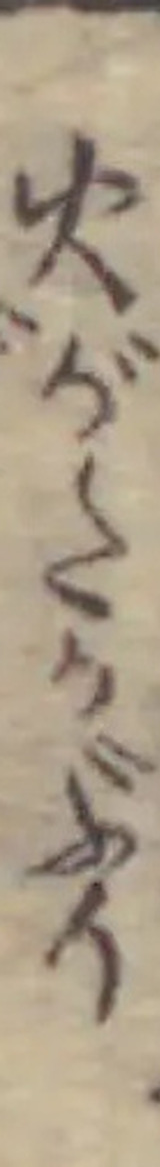火がたかぶり
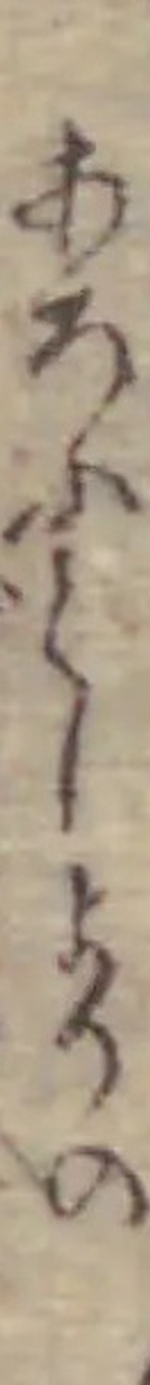あろふとしよりの
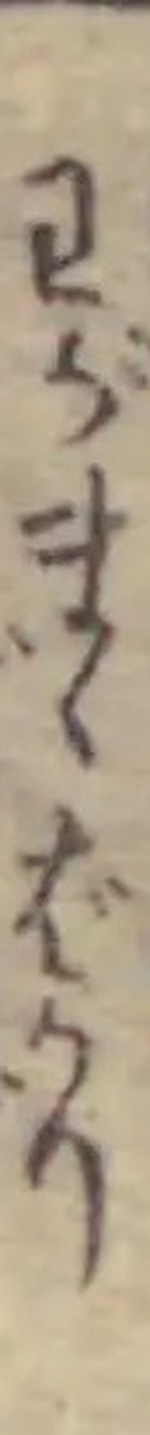わがまゝばかり
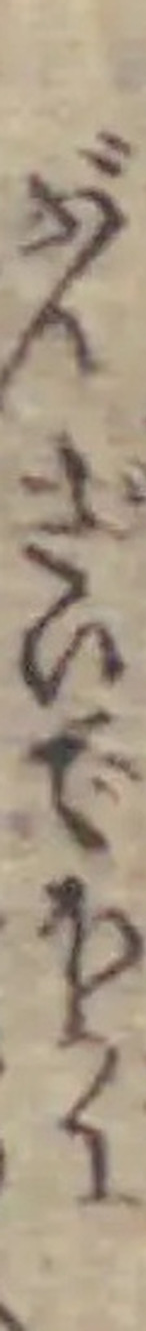ぶんざいでほかに
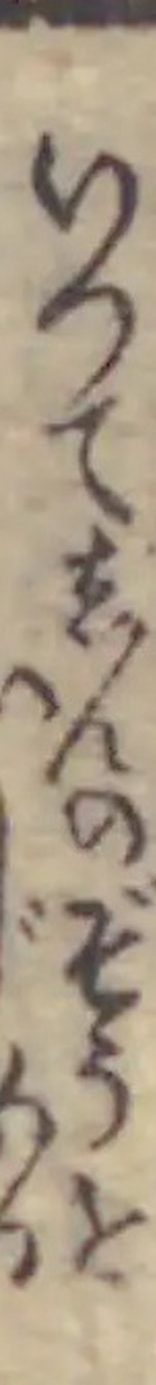いつてじんのぞうを
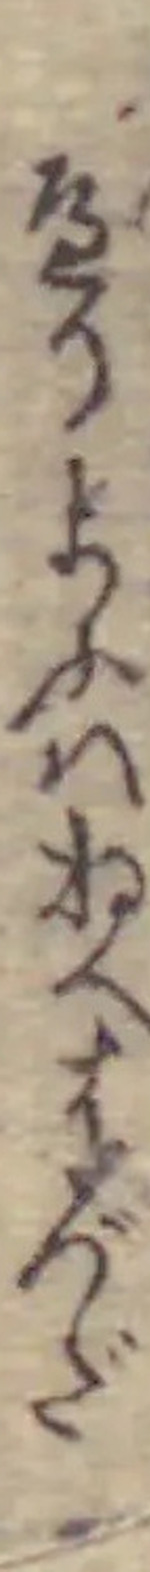へりよふはねへはづだ
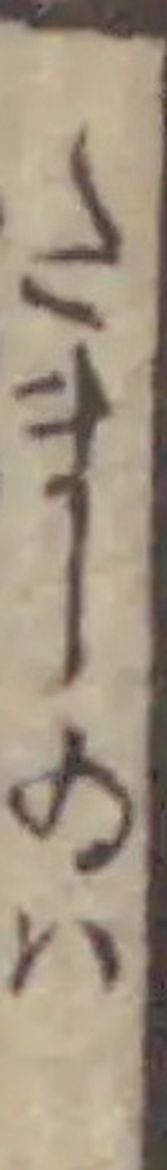たましゐは
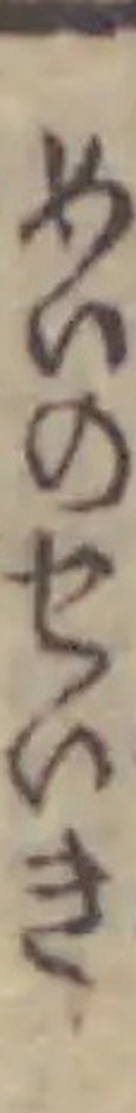めいのせいき
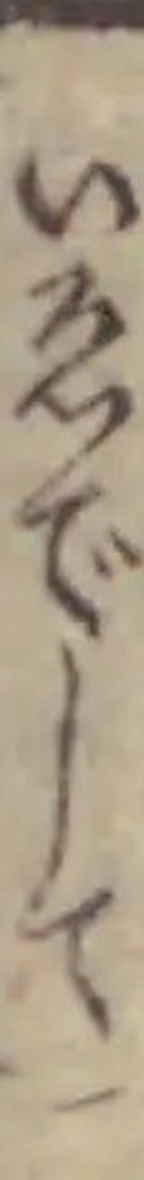いゑでして
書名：腹内養生主論 3巻
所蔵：国立国会図書館 National Diet Library, JAPAN
